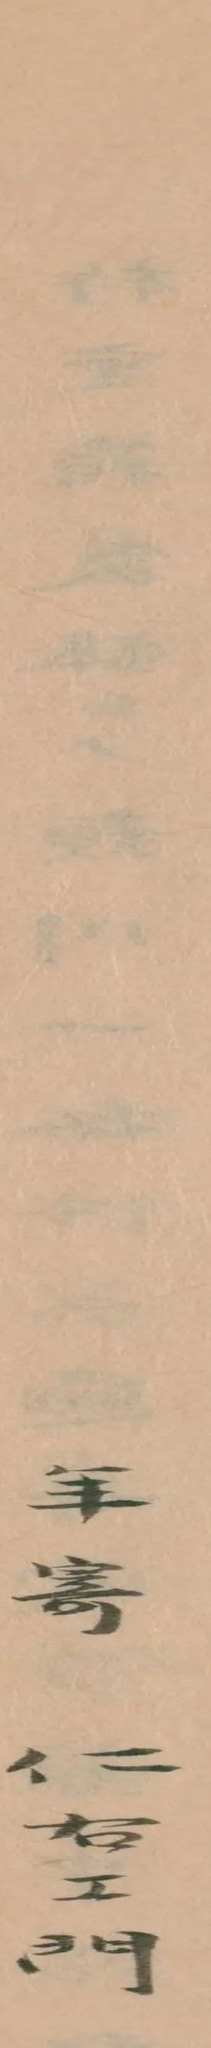年寄仁右エ門
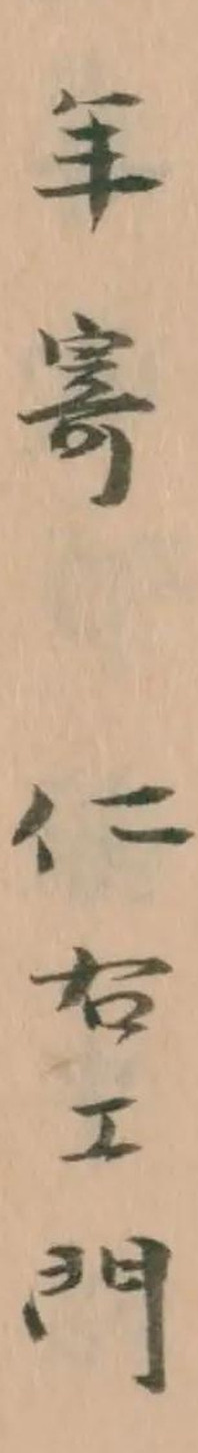年寄仁右エ門
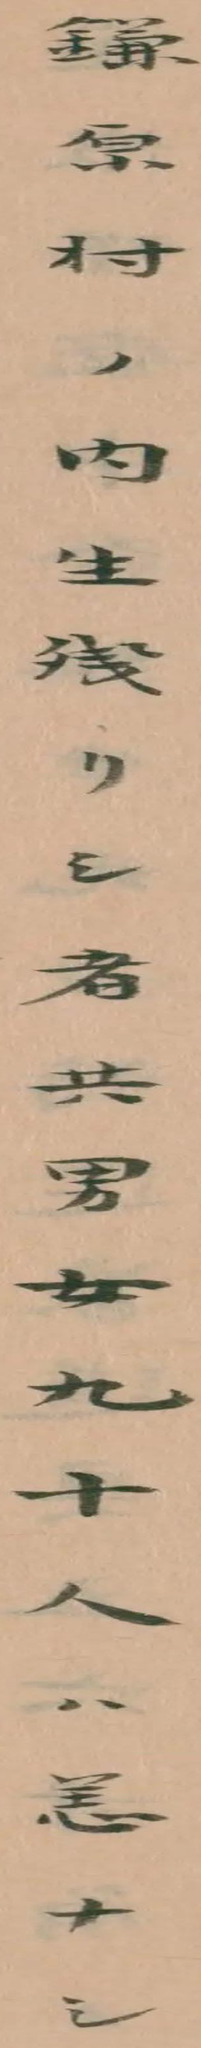鎌原村ノ内生残リシ者共男女九十人ハ恙ナシ
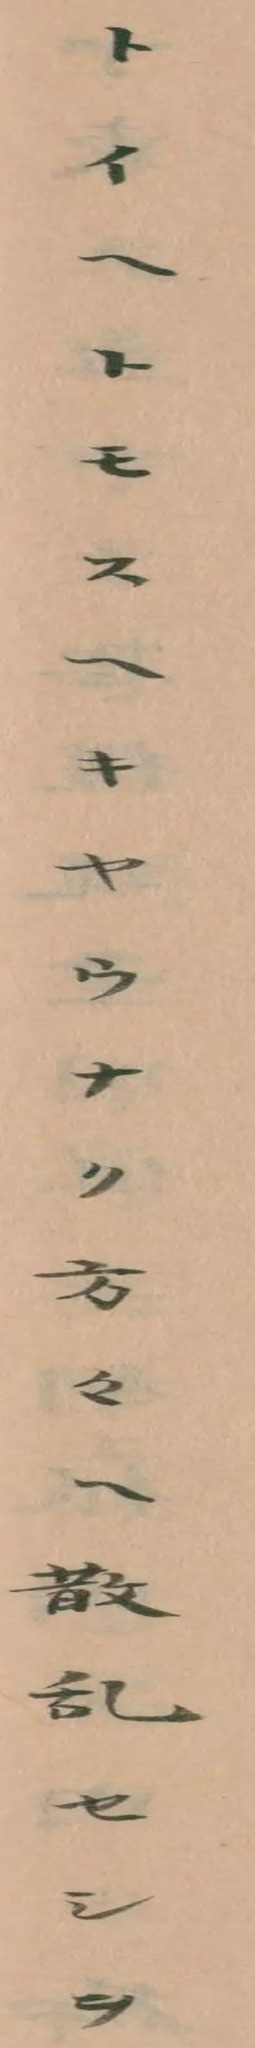トイへトモスヘキヤウナク方々へ散乱セシヲ
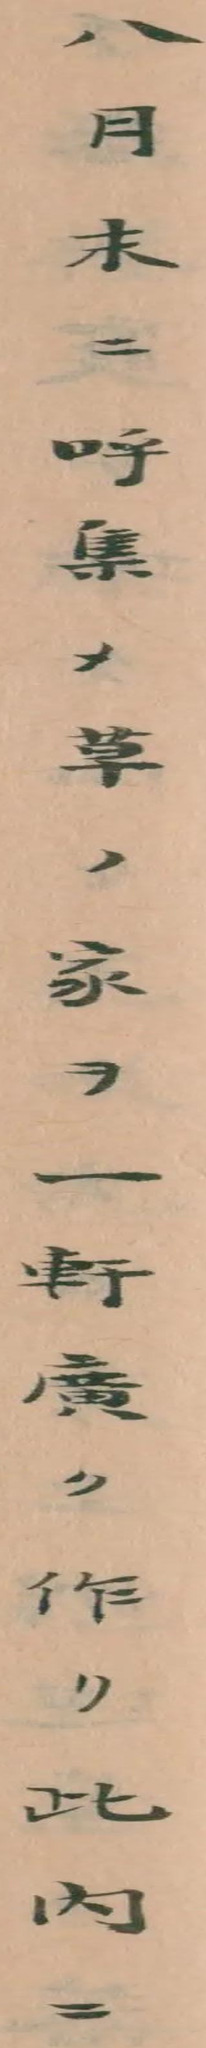八月未ニ呼集メ草ノ家ヲ一軒広ク作り此内二
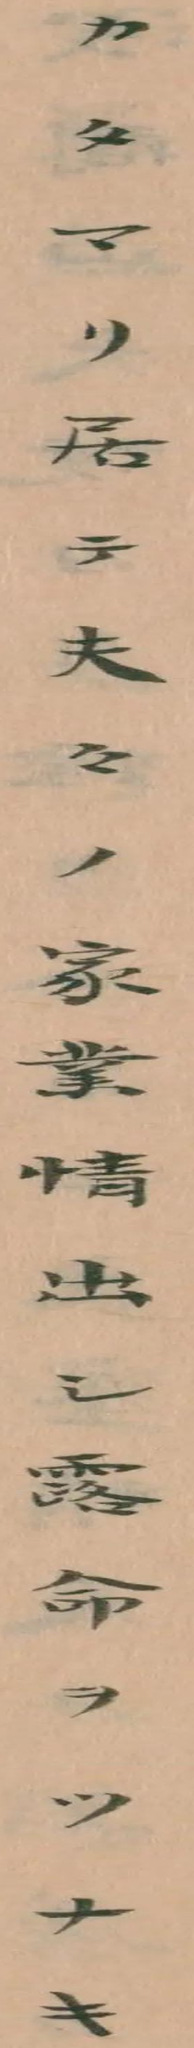カタマリ居テ夫々ノ稼業情出シ露命ヲツナキ
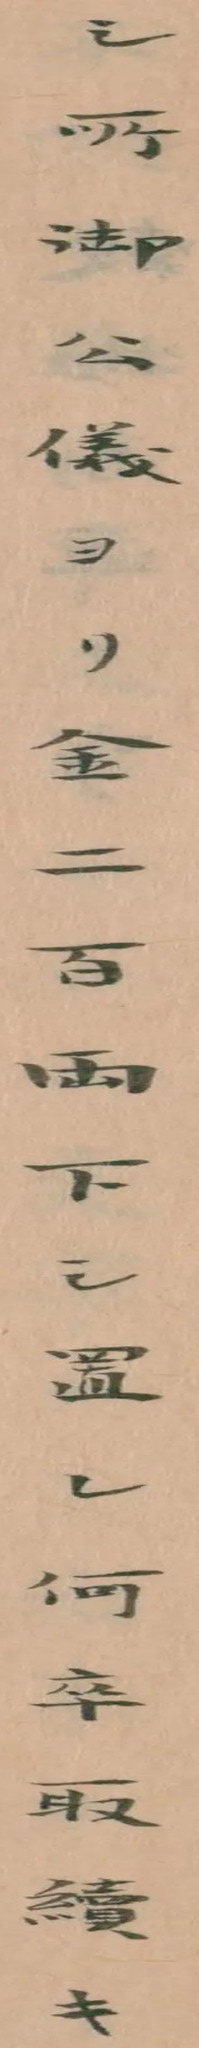シ所御公儀ヨリ金二百両下シ置レ何卒取続キ
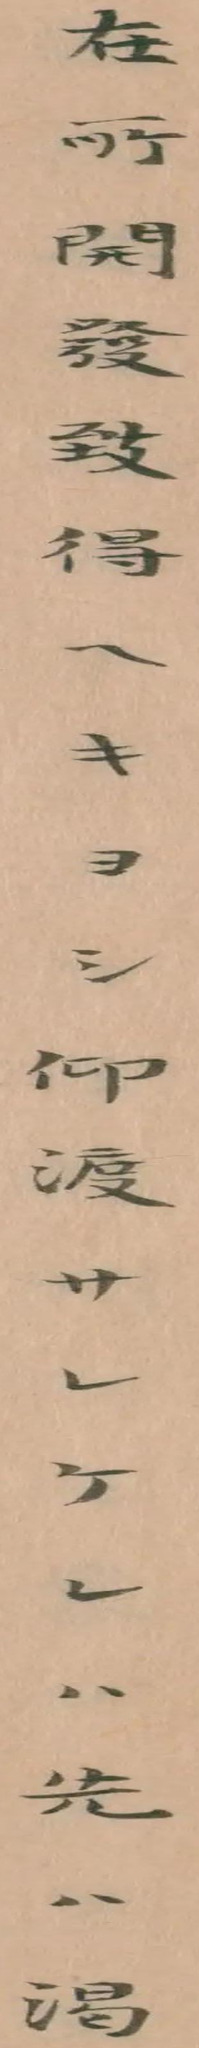在所開発致得ヘキヨシ仰渡サレケレハ先ハ渇
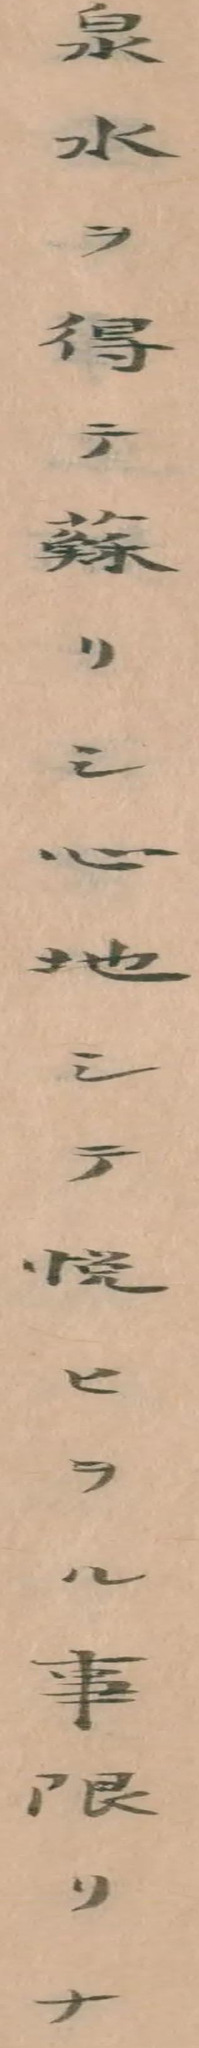泉水ヲ得テ蘇りシ心地シテ悦ヒラㇽ事限りナ
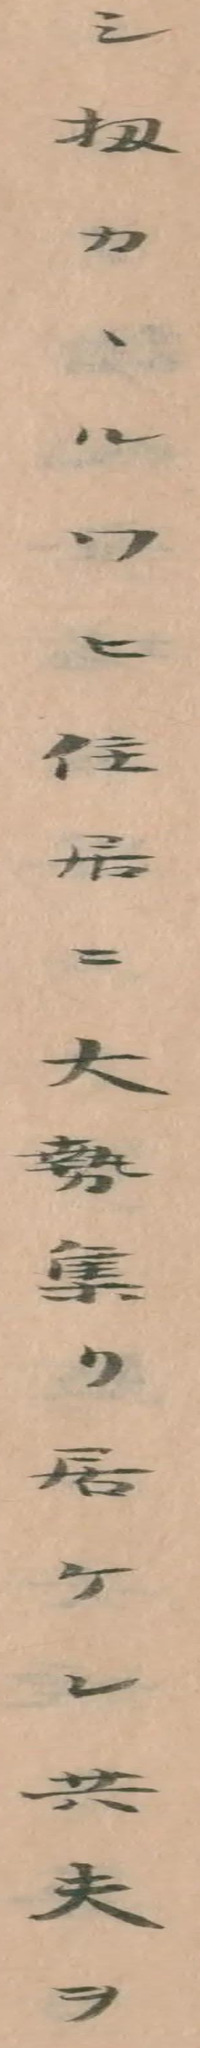シ扨カゝルワヒ住居二大勢集り居ケレ共夫ヲ
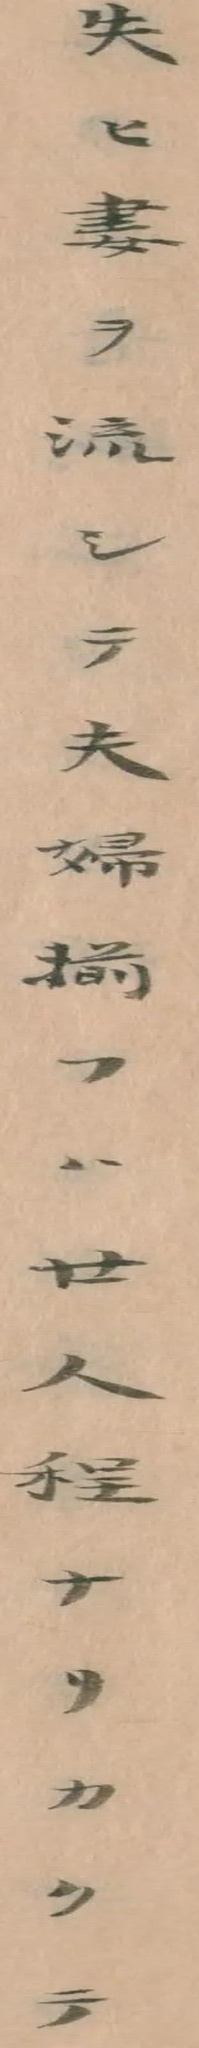失ヒ妻ヲ流シテ夫婦揃フハ廿人程ナリカクテ
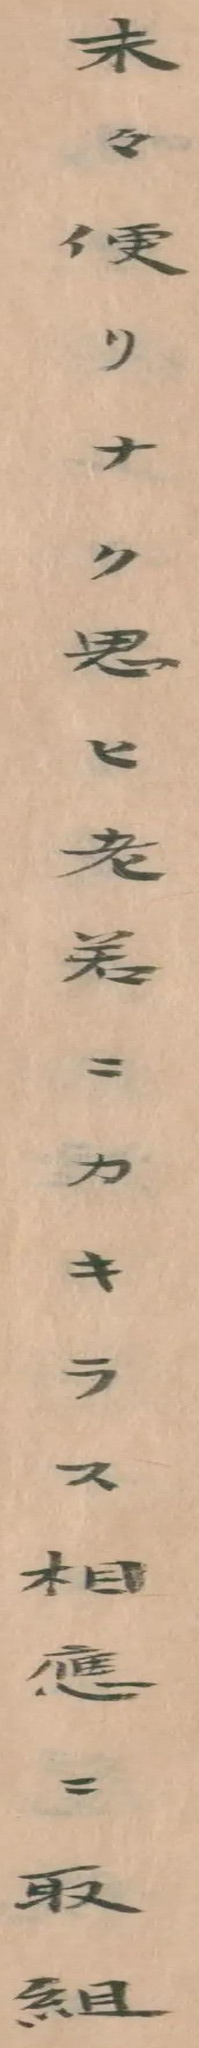未々便りナク思ヒ老若二カキラス相応二取組
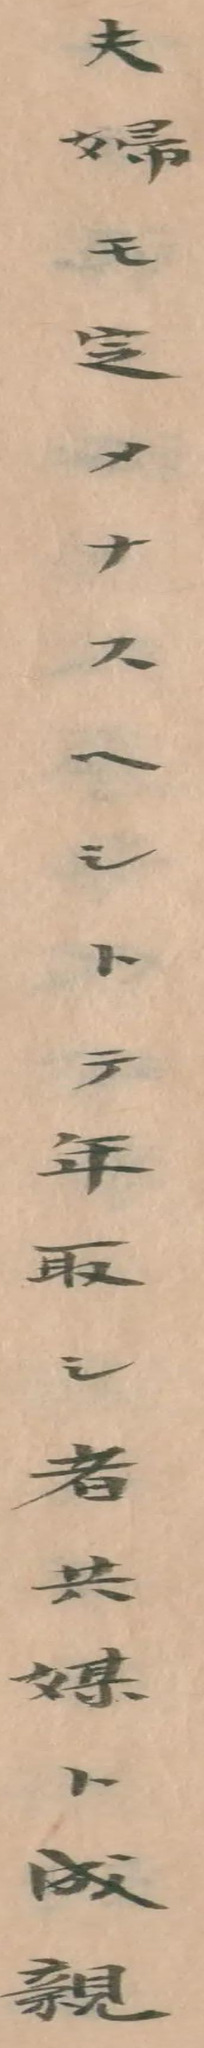夫婦モ定メナスへシトテ年取シ者共妹ト成親
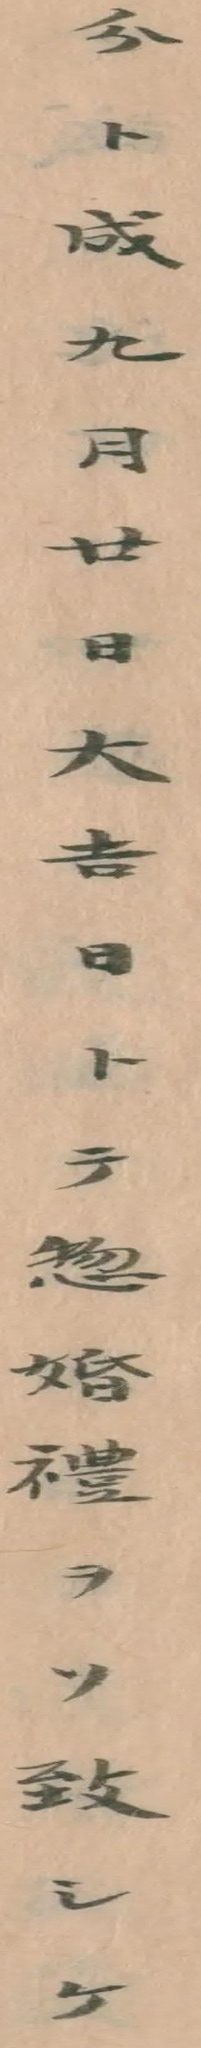分ト成九月廿日大吉日トテ惣婚礼ヲソ致シケ

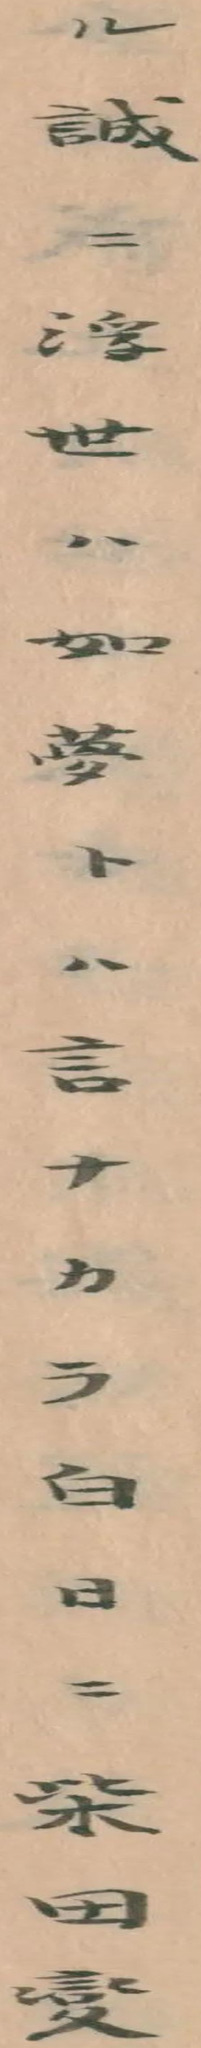ル誠二浮世ハ如夢トハ言ナカラ白日二柴田変
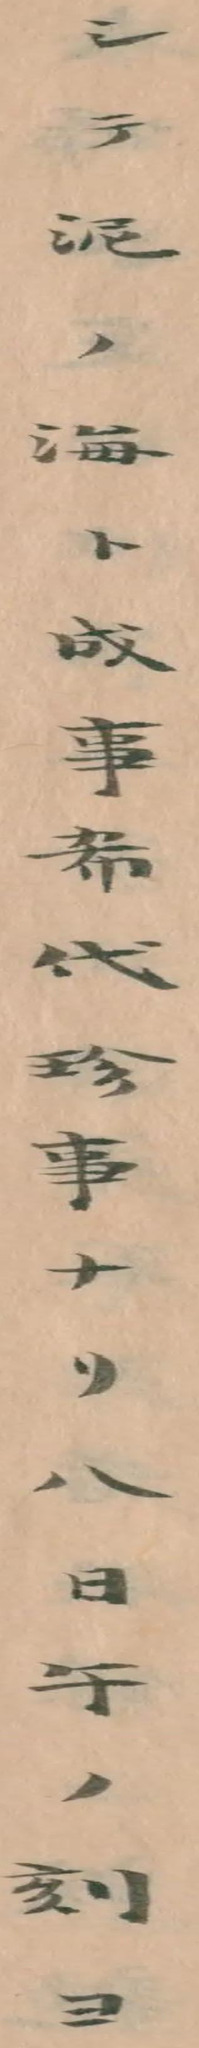シテ泥ノ海ト成事希代珍事ナリ八日午ノ刻ヨ
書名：地災撮要. 巻3(地震之部)-巻4(噴火之部)
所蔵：国立国会図書館 National Diet Library, JAPAN
